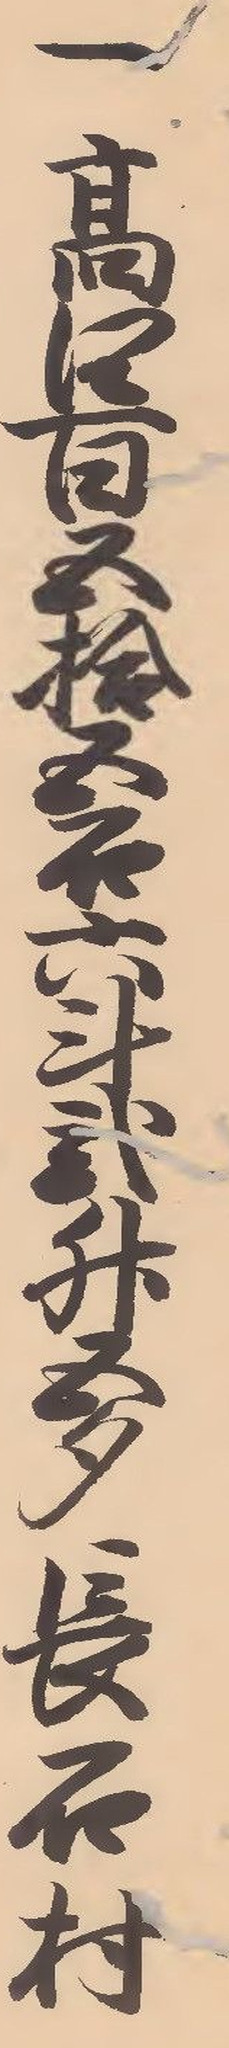一高四百五拾五石六斗弐升五勺長石村
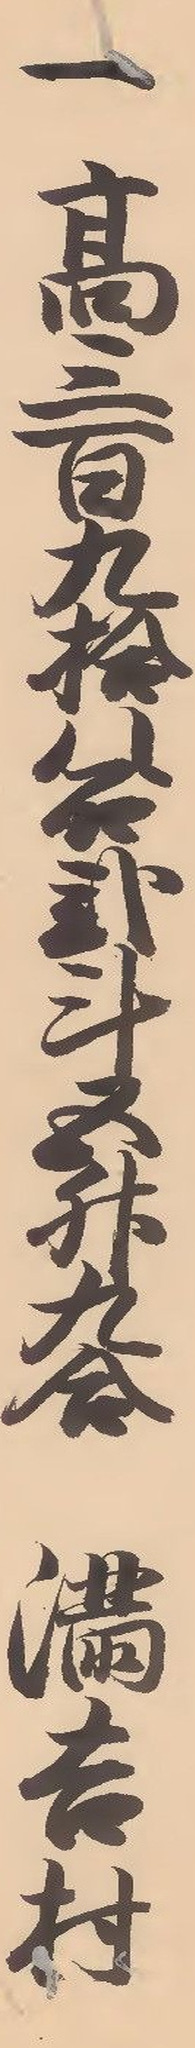一高三百九拾八石弐斗五升九合満吉村
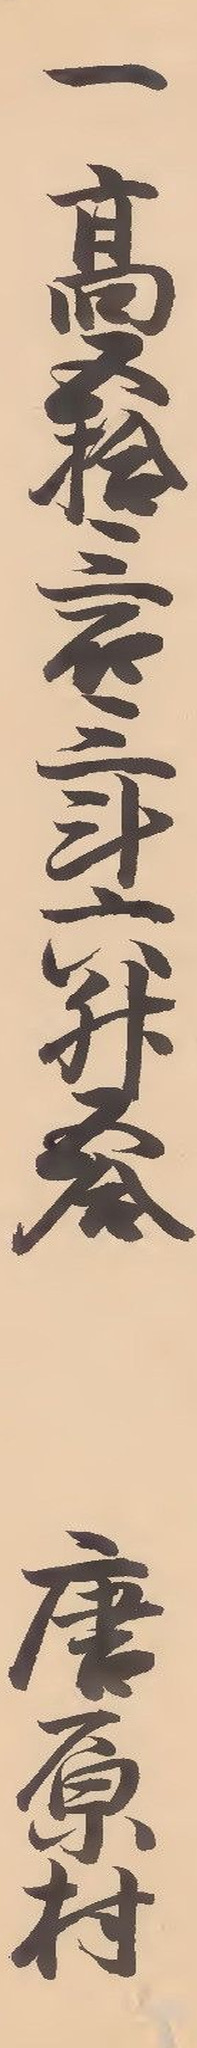一高五拾三石三斗六升五合唐原村
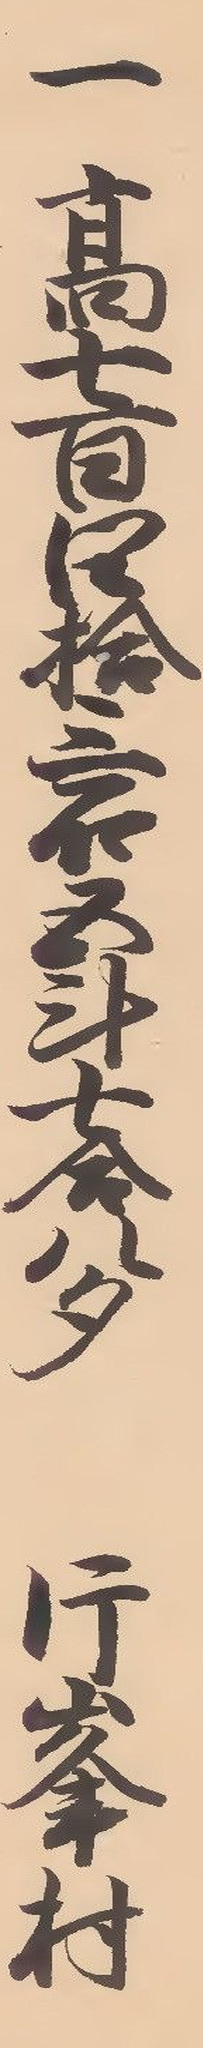一高七百四拾三石五斗七合八勺片峰村
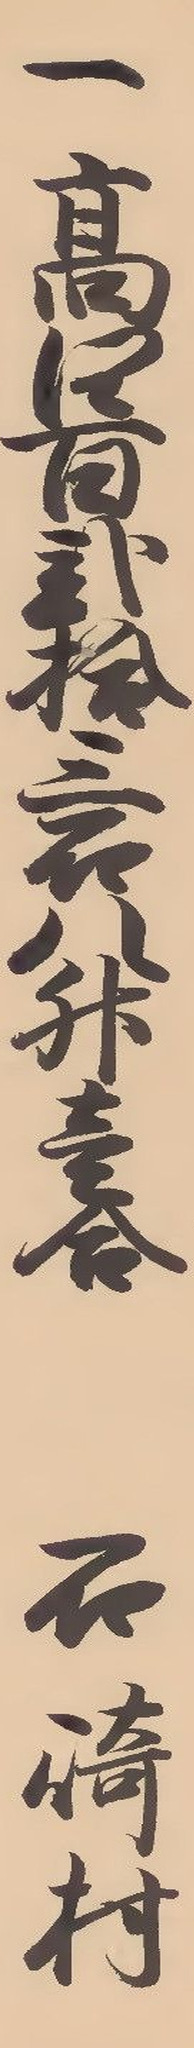一高四百弐拾三石八升壱合石崎村
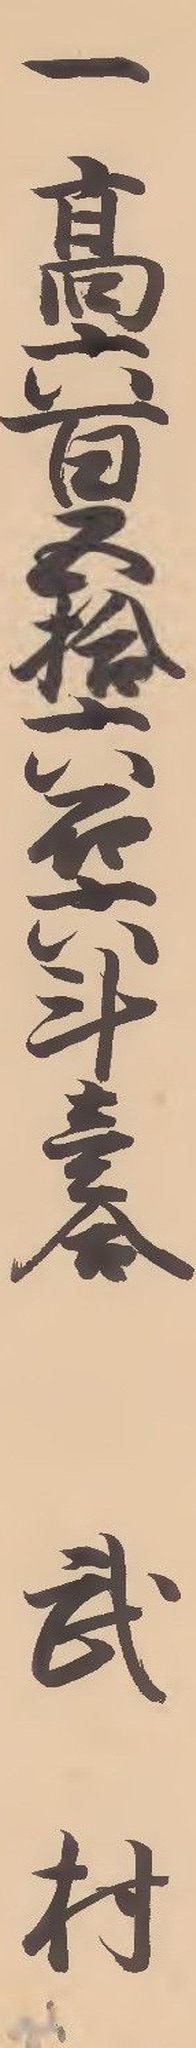一高六百五拾六石六斗壱合武村
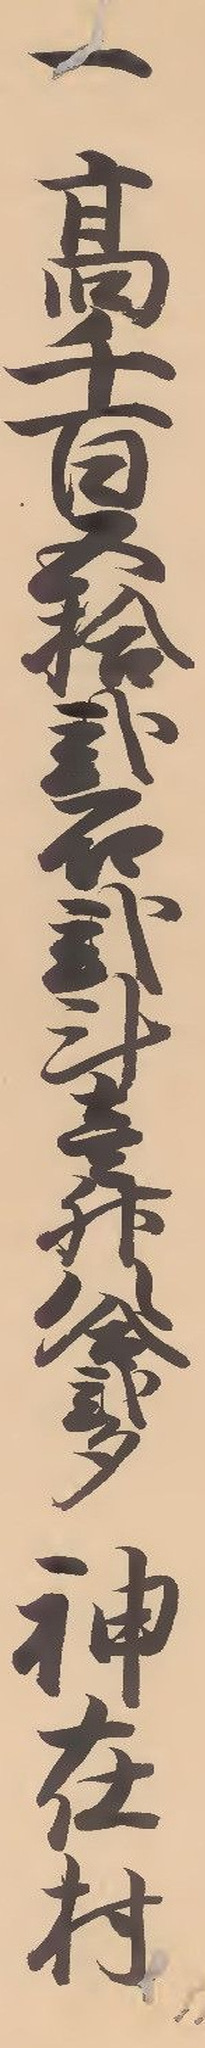一高千百五拾弐石弐斗壱升八合弐勺神在村
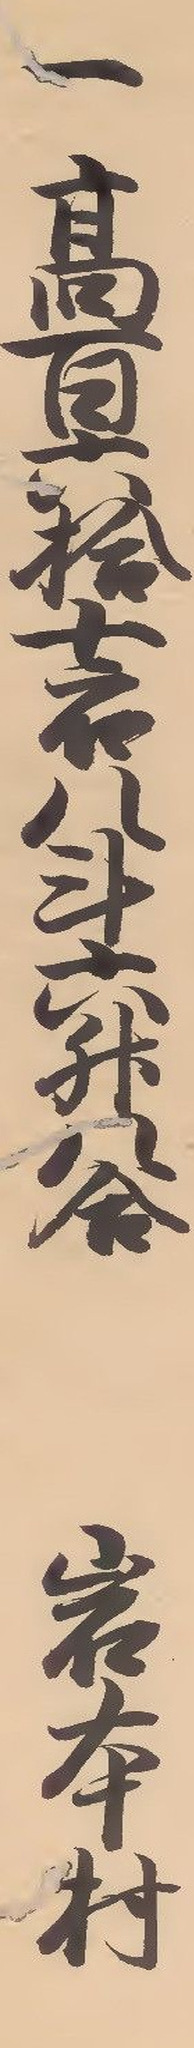一高百六拾七石八斗六升八合岩本村

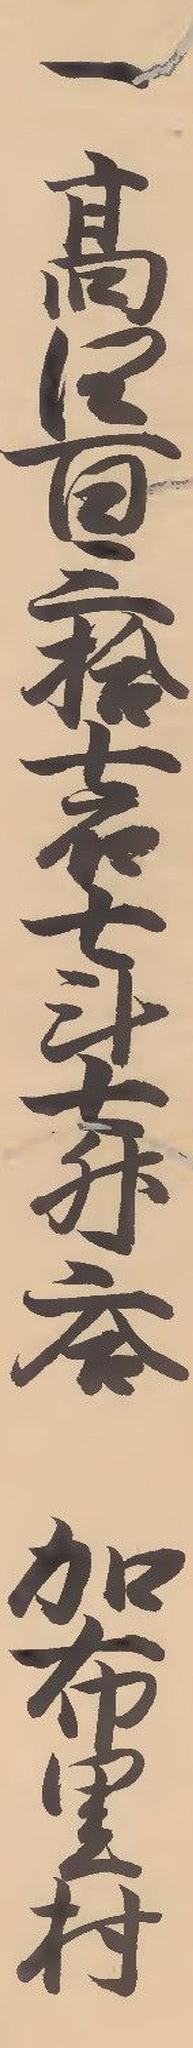一高四百三拾七石七斗七升三合加布里村
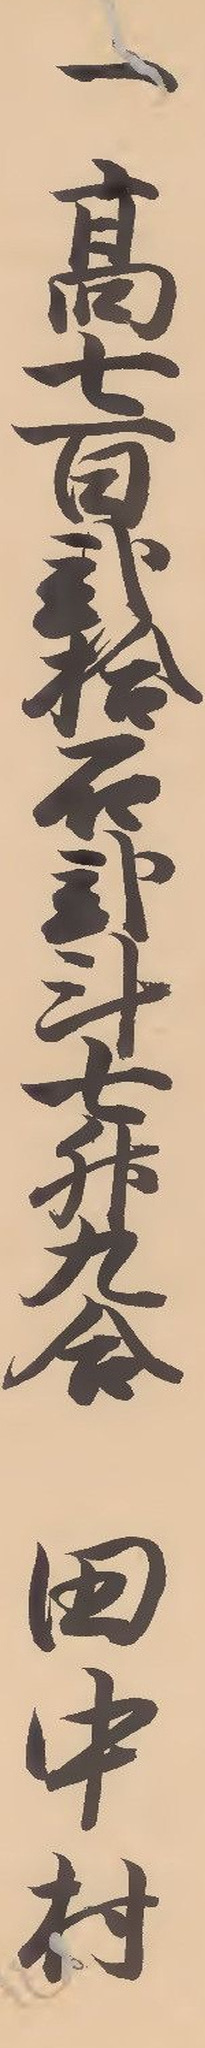一高七百弐拾石弐斗七升九合田中村
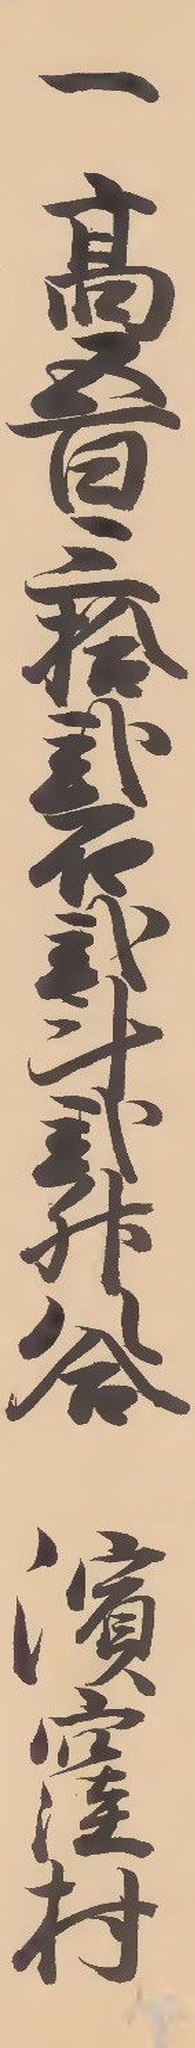一高五百三拾弐石弐斗弐升八合浜窪村
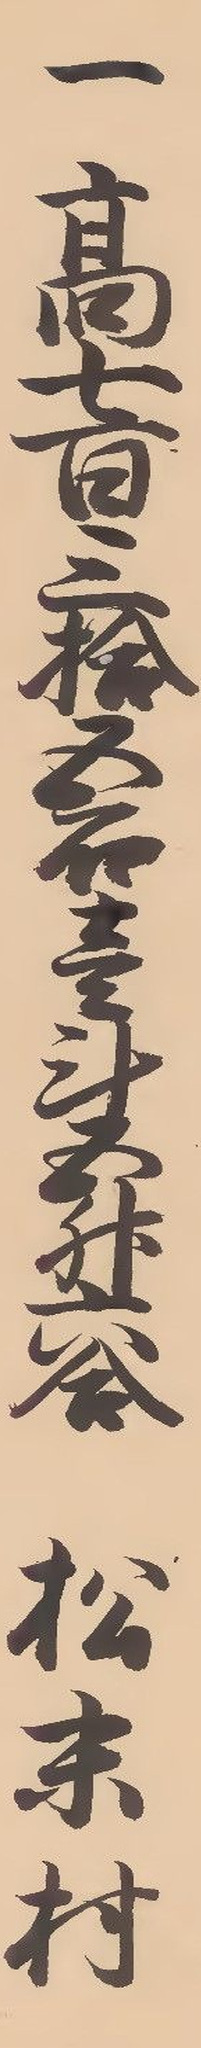一高七百三拾五石壱斗五升六合松末村
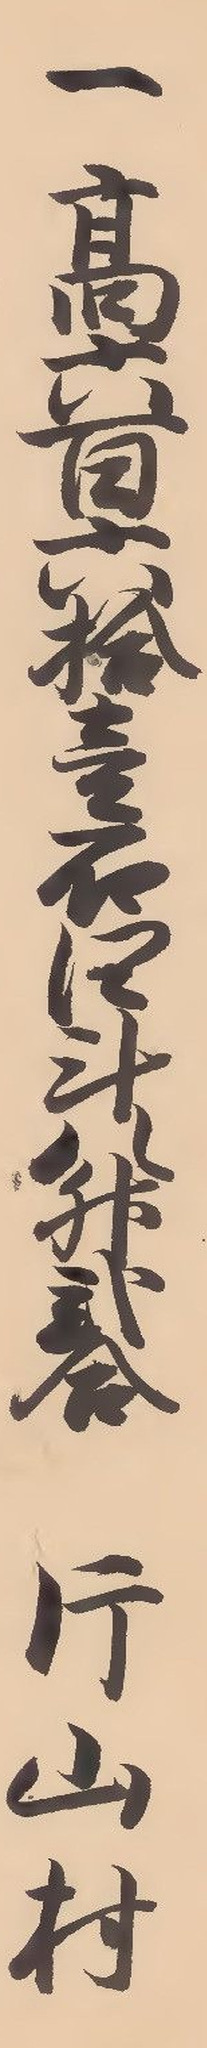一高六百六拾壱石四斗八升弐合片山村
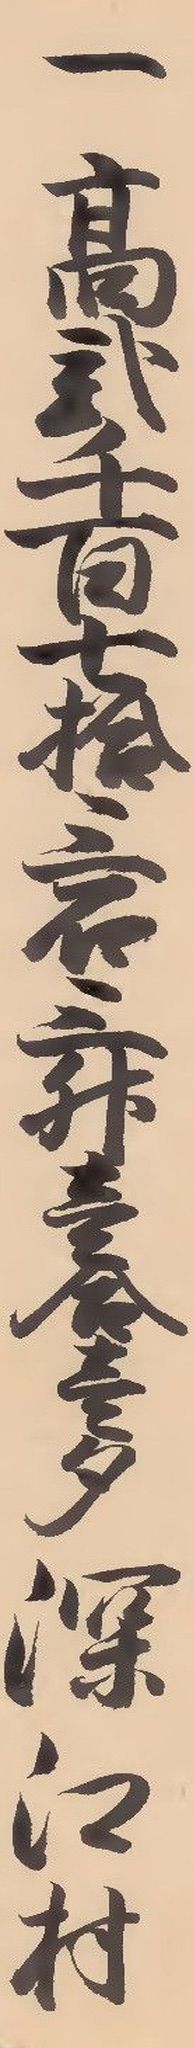一高弐千百七拾三石三升壱合壱勺深江村
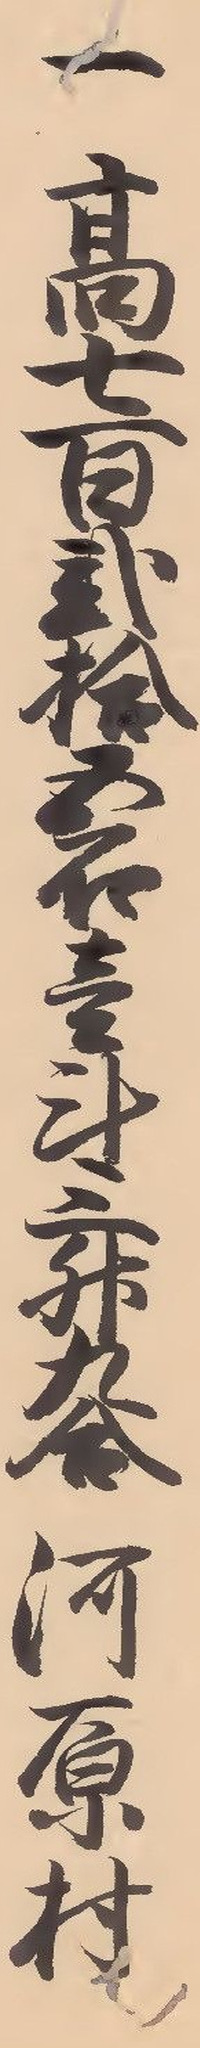一高七百弐拾五石壱斗三升九合河原村
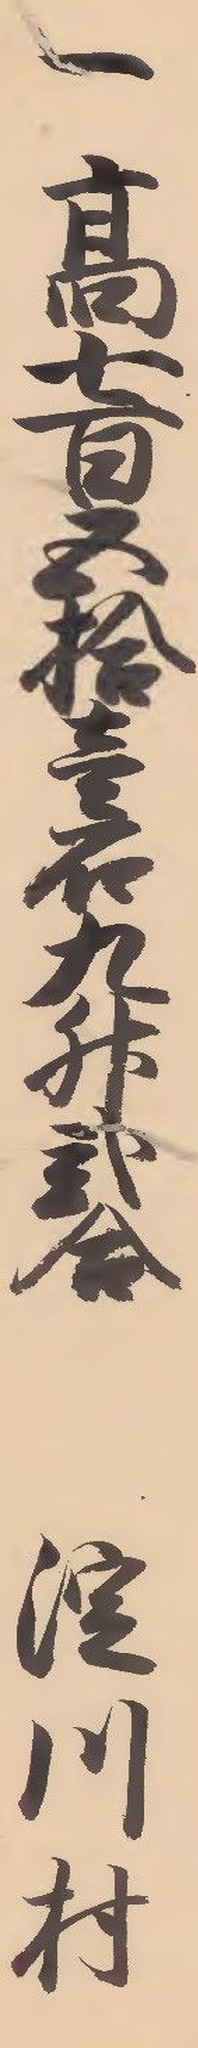一高七百五拾壱石九升弐合淀川村
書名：筑前国郷帳
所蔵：国立公文書館 National Archives of Japan
